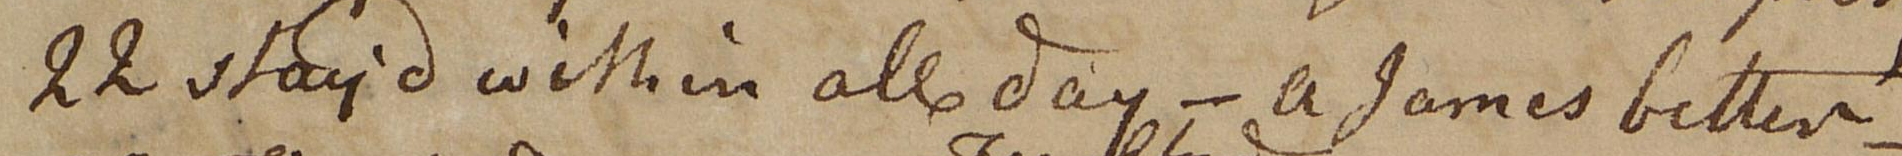22 stay'd within all day- A James better-
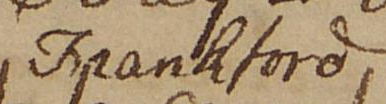Frankford
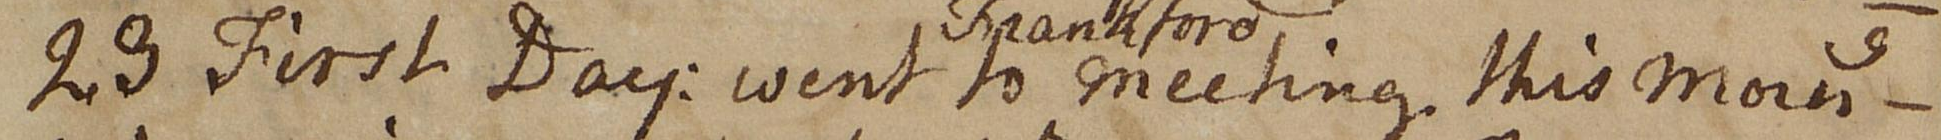23 First Day: went to ^ meeting this morn^g-
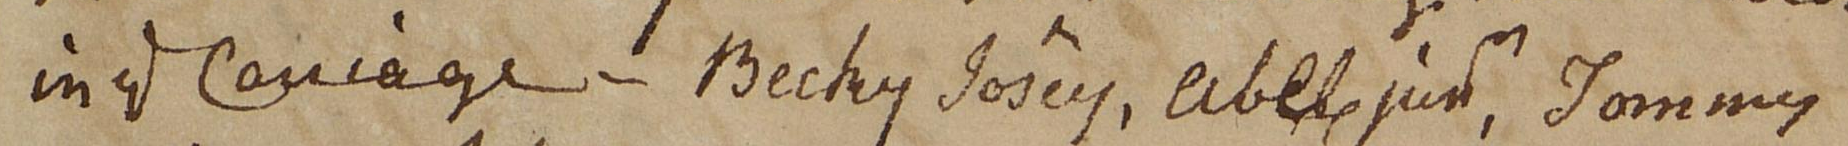in y^e Carriage- Becky Josey, Abel jun^r, Tommy
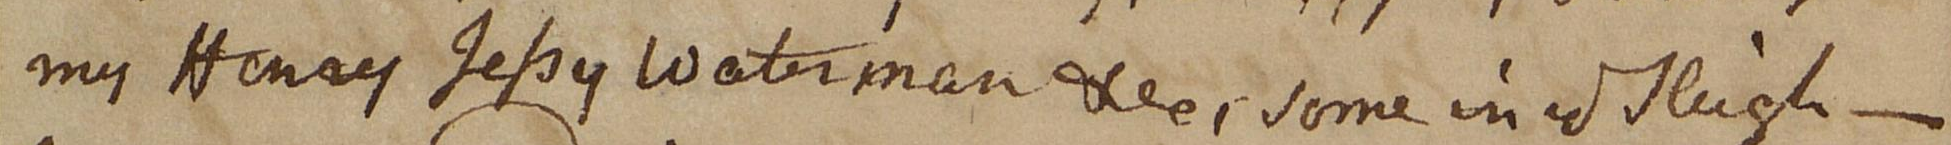my Henry Jessy Waterman &c, some in y^e Sleigh-
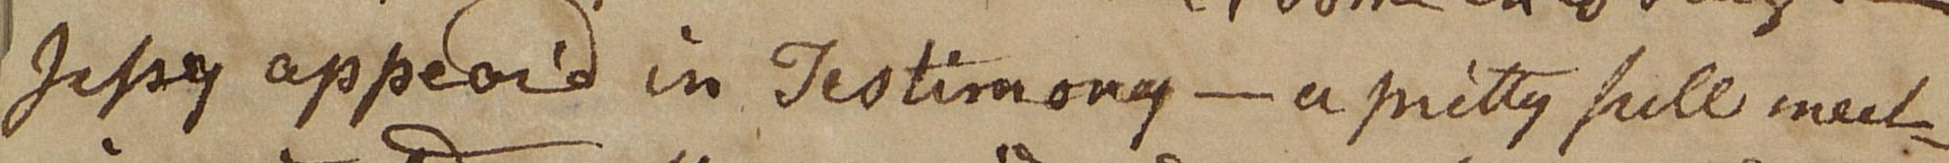Jessy appear'd in Testimony- a pritty full meet-
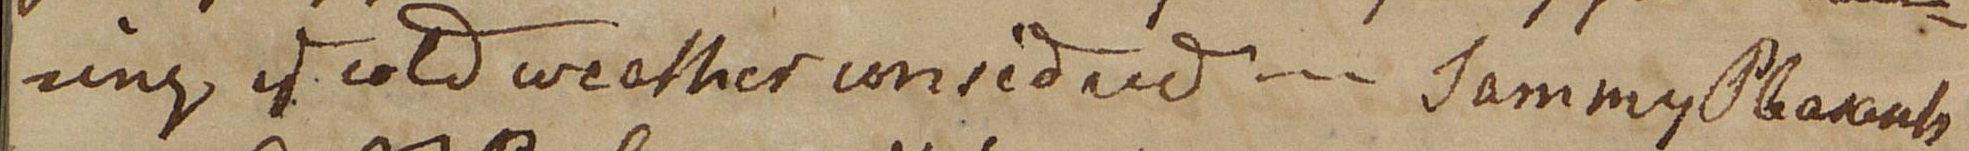ing y^e cold weather considred- Sammy Pleasants
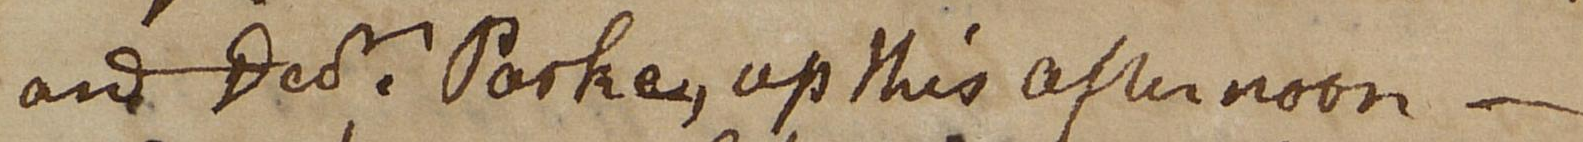and Deb^r. Parke, up this afternoon-
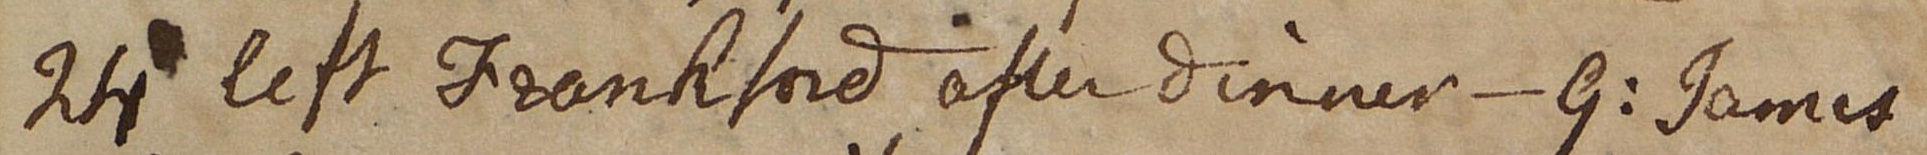24 left Frankford after dinner- G: James
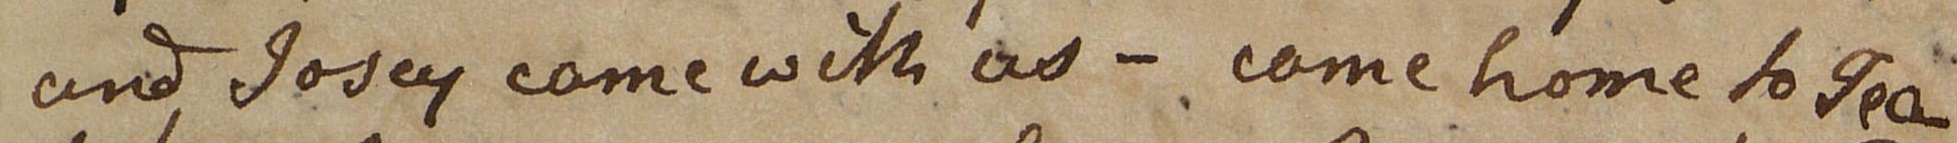and Josey came with as- come home to Tea
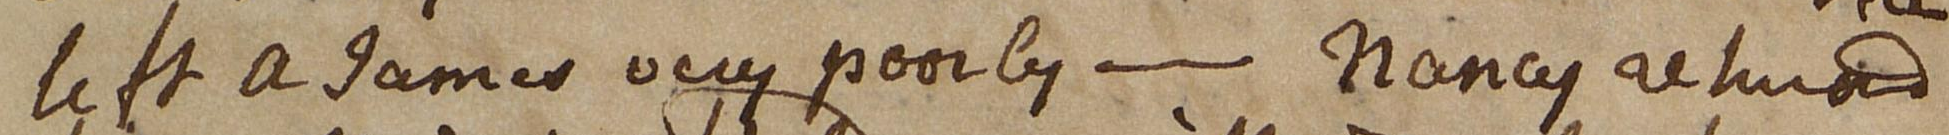left A James very poorly- Nancy return'd
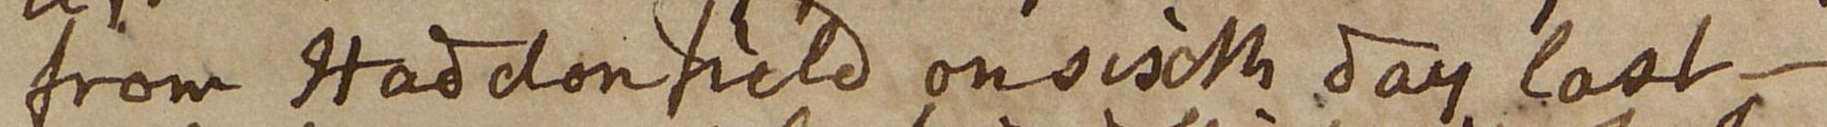from Haddonfield on sixth day last-
